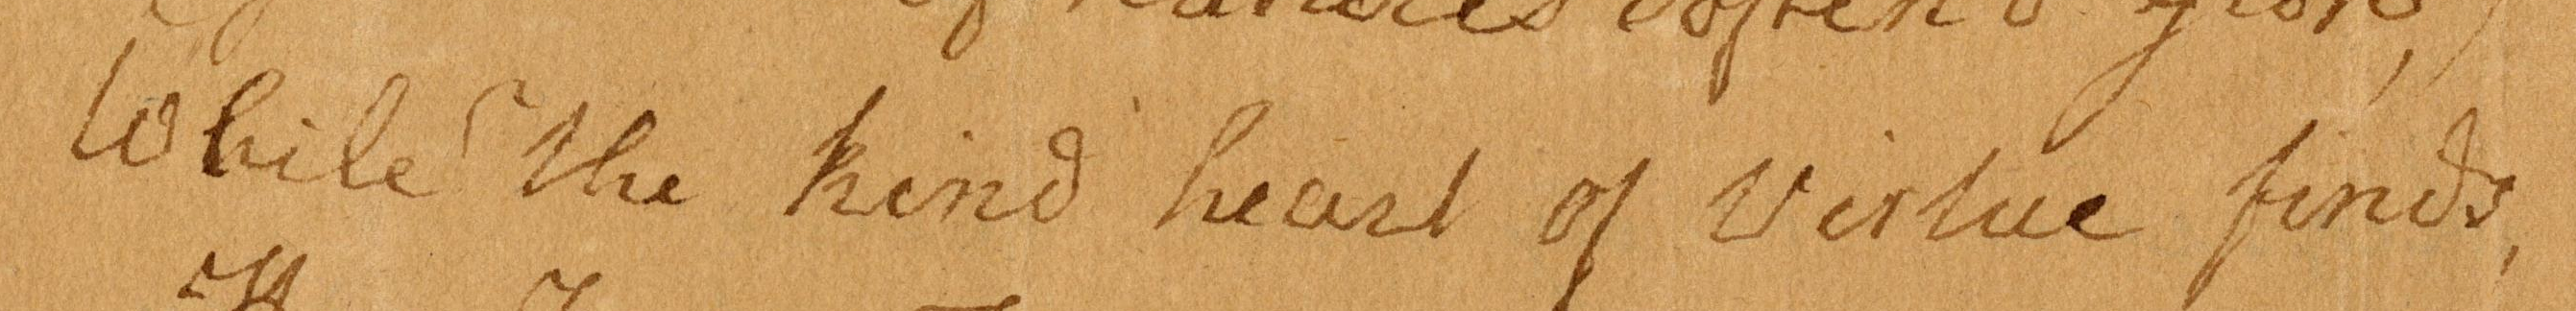While the kind heart of Virtue finds,
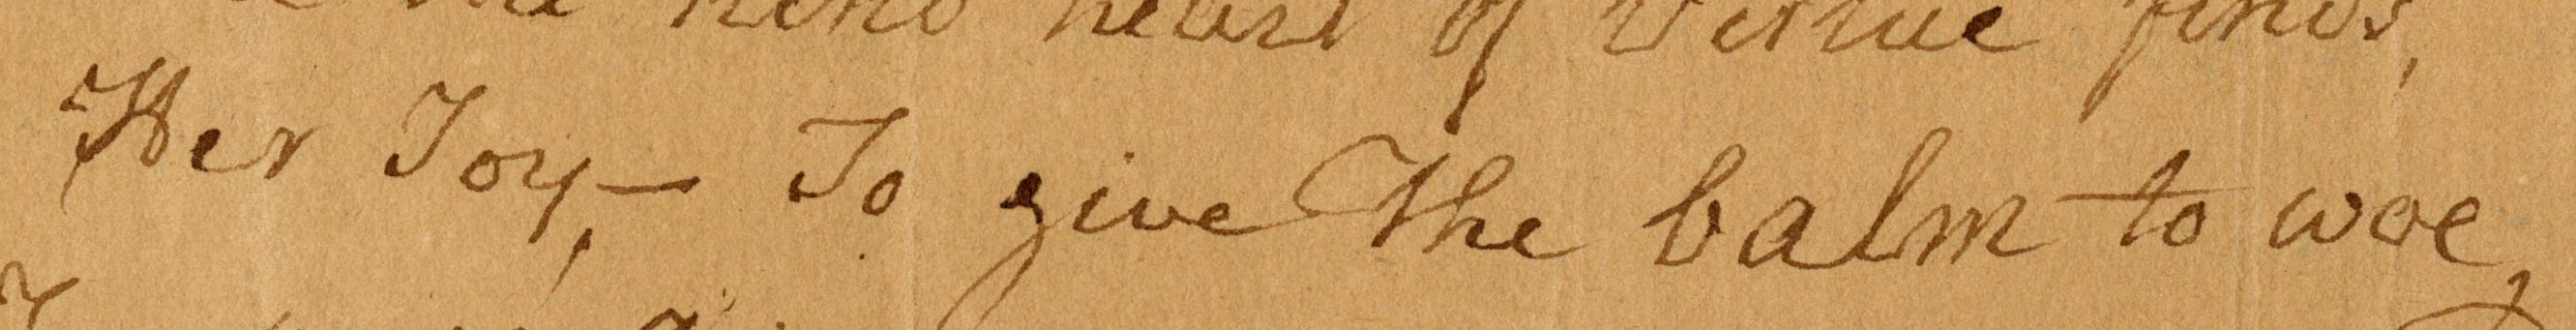Her Joy- To give The balm to woe,
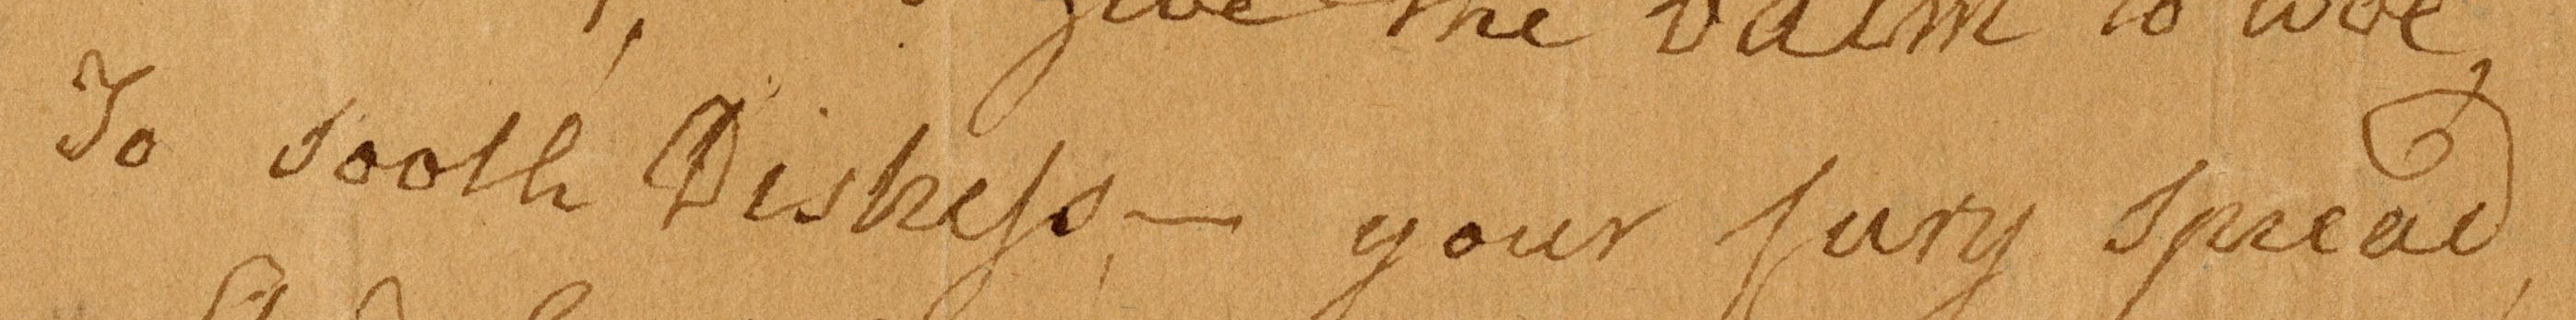To Sooth Distress- your Jury spread,
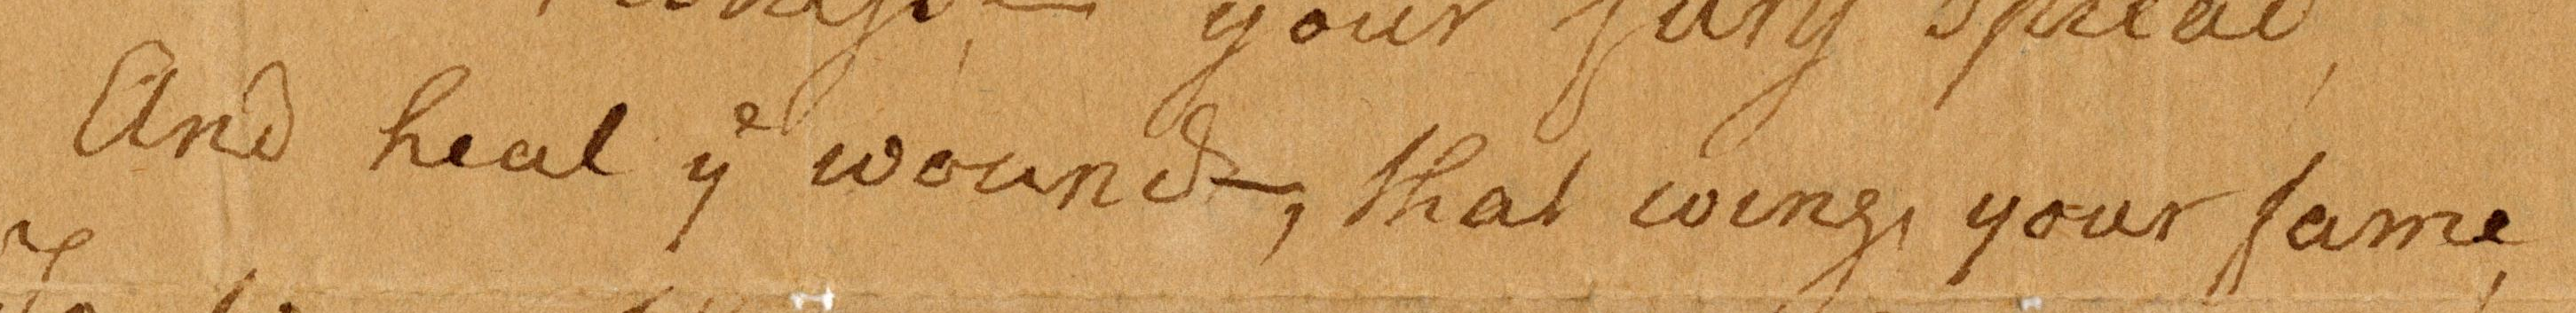And heal y^e wound-, that wing, your fame,
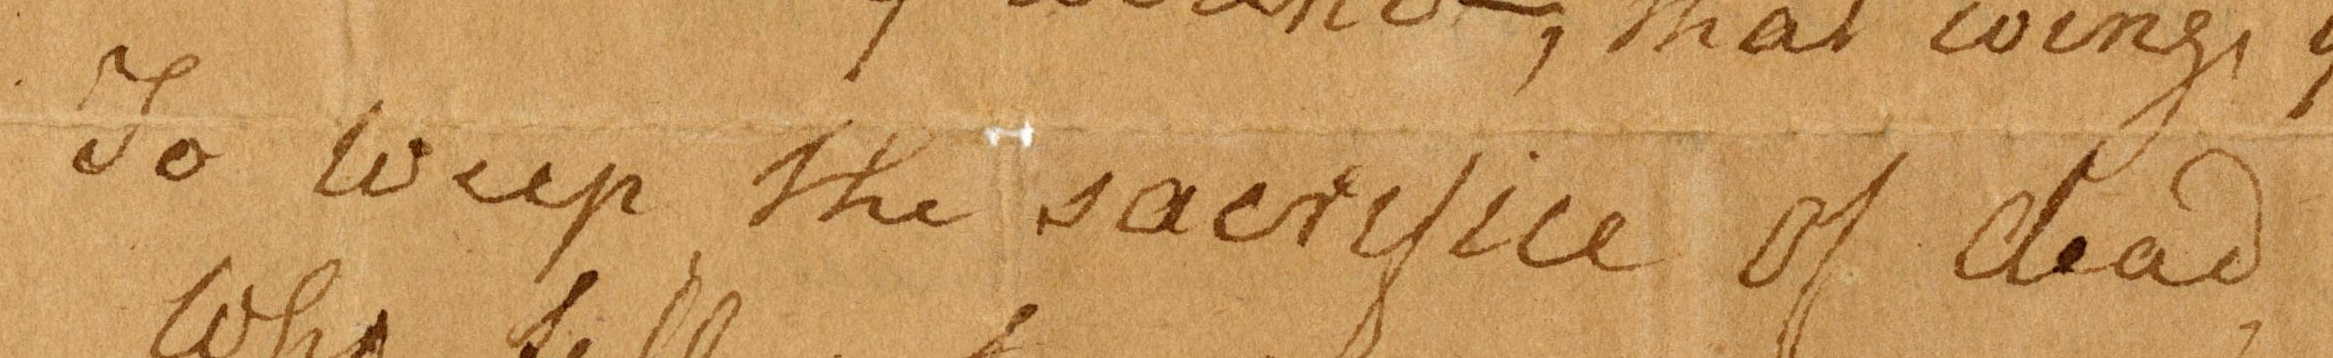To Weep the sacrifice of dead,
